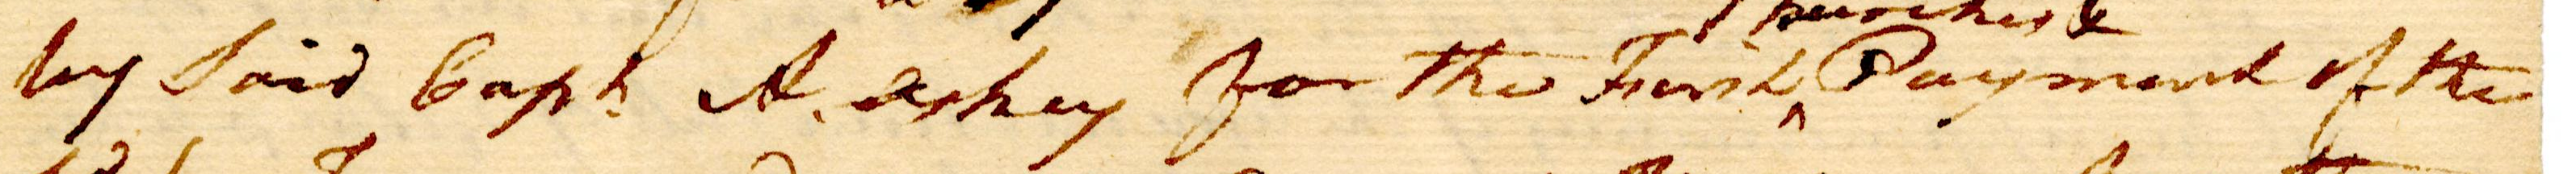by Said Cap^t. A. askey for the First ^ Payment of the
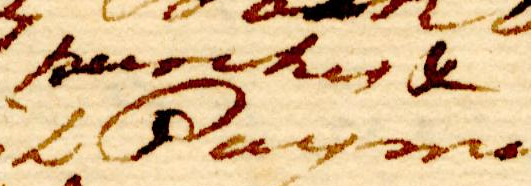purchases &
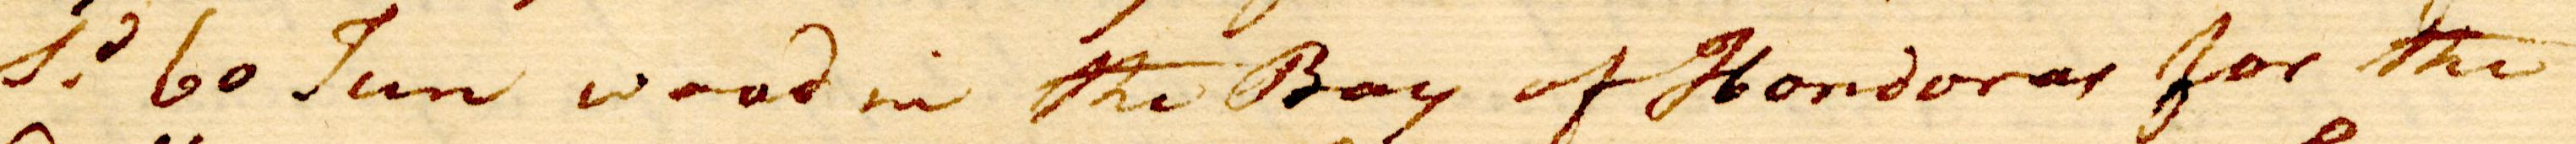S^d. 60 Tun wood in the Bay of Hondoras for the
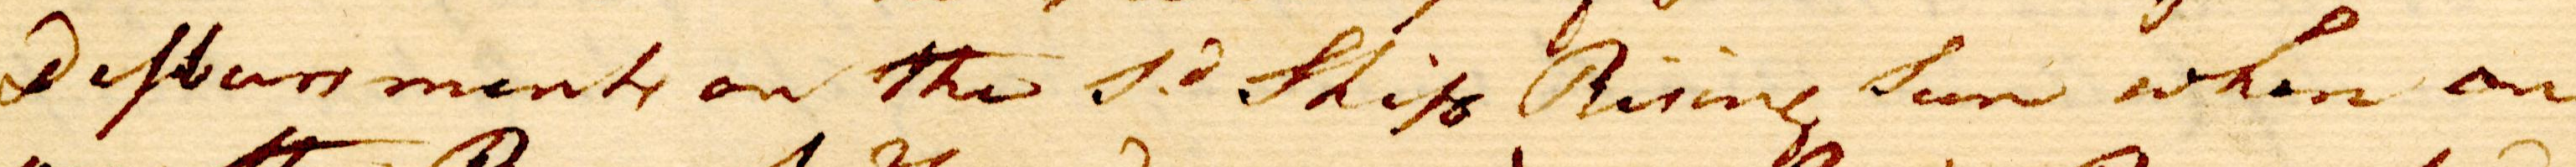disbursements on the s^d Ships Rising Sun when on
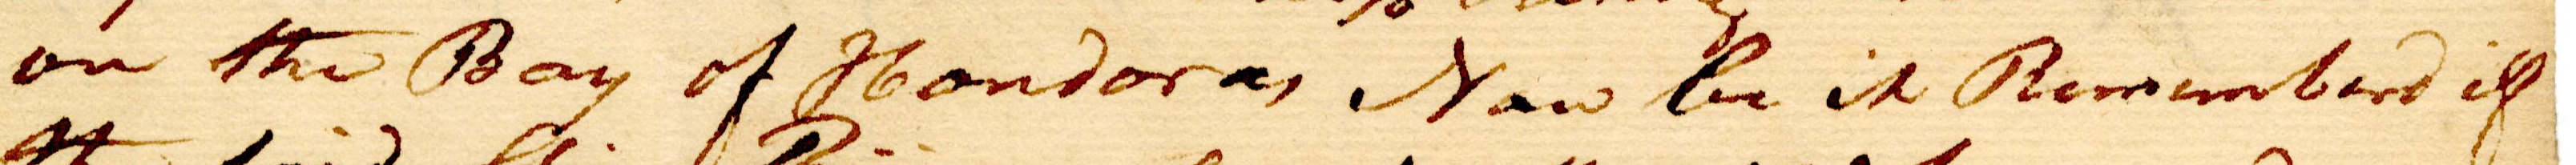on the Bay of Hondoras Now be it Rememberd if
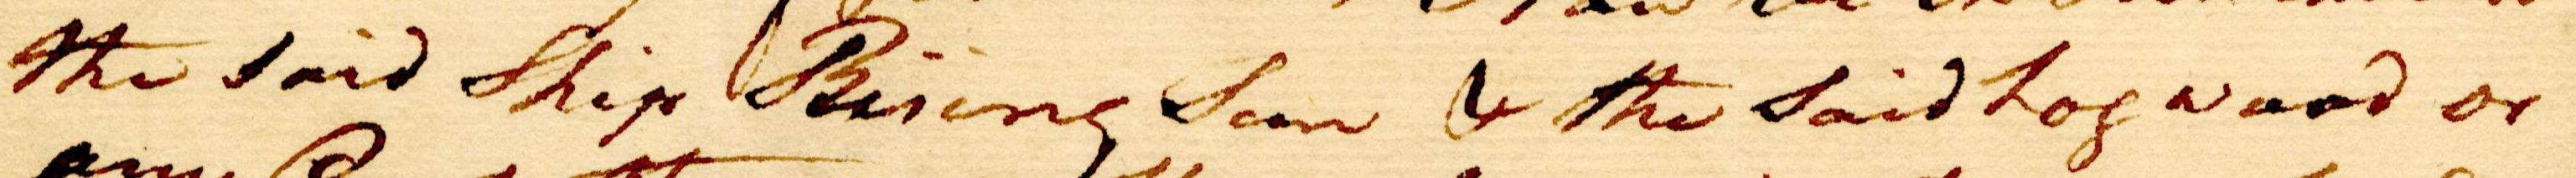the said Ship Rising Sun & the said Logwood or
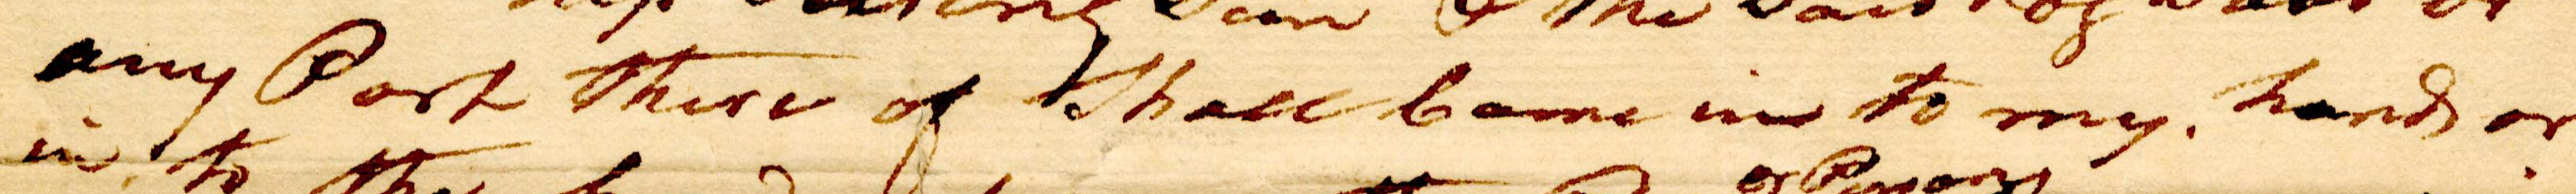any Part there of shall Come in to my hand or
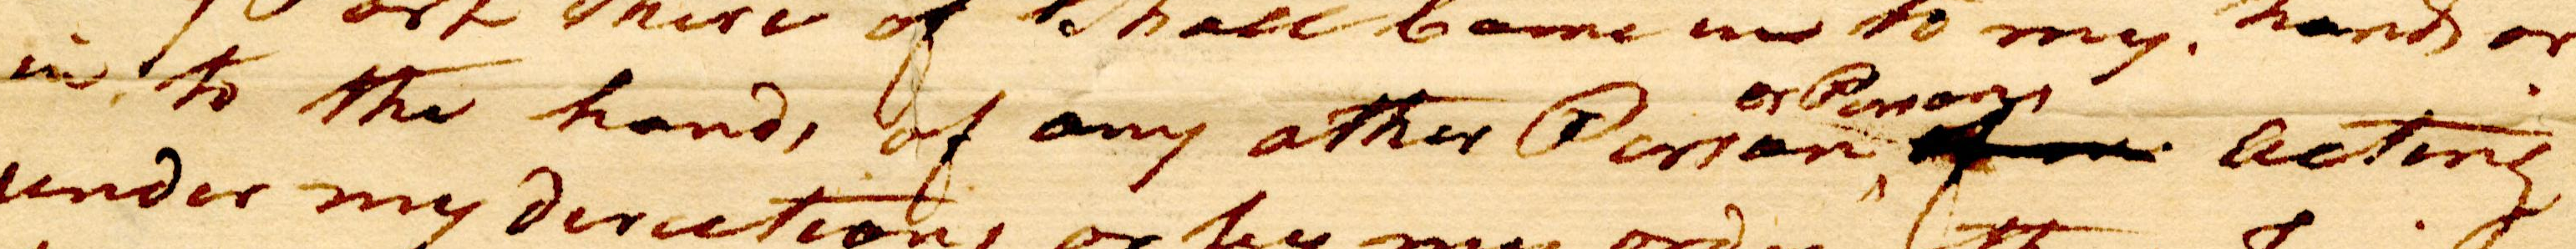in to the hands of any other Person ^ [___] acting
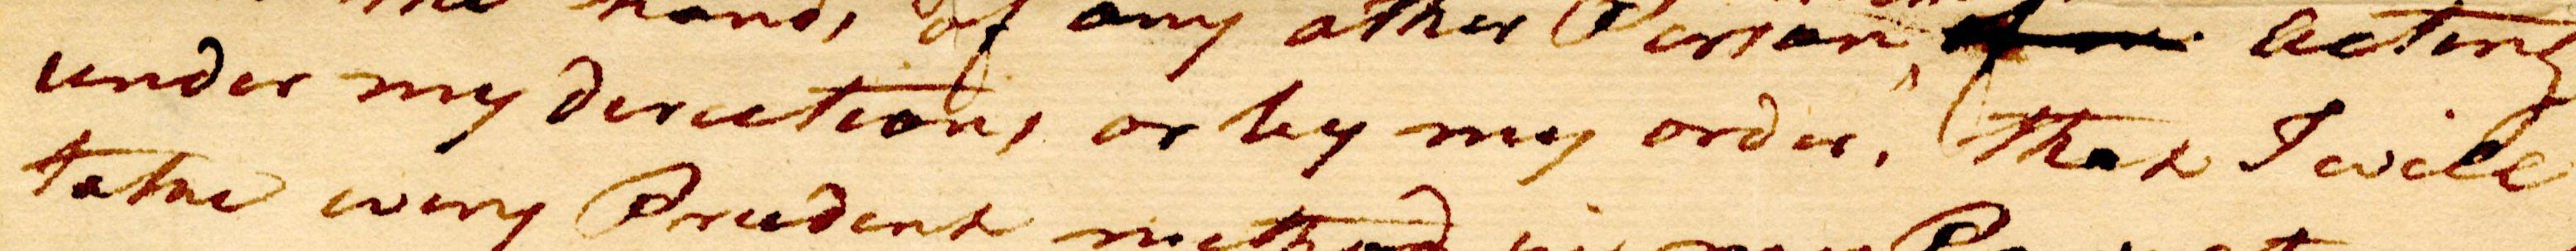under my directions or by my order. that I will
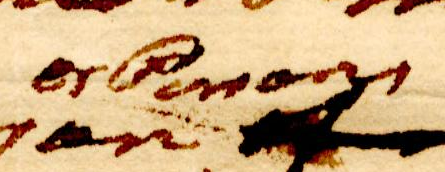or persons
